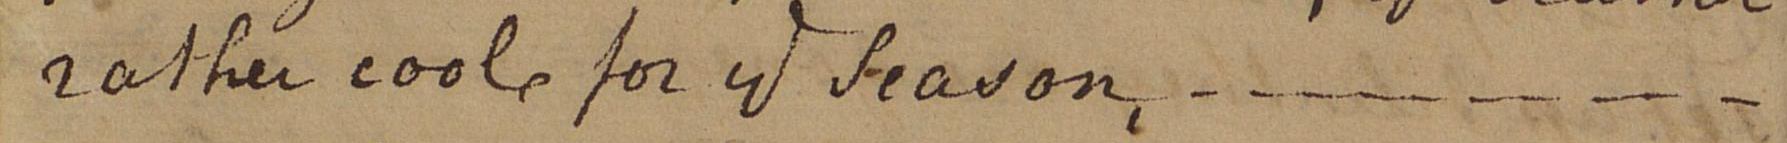rather cool for y^e Season,-- - --
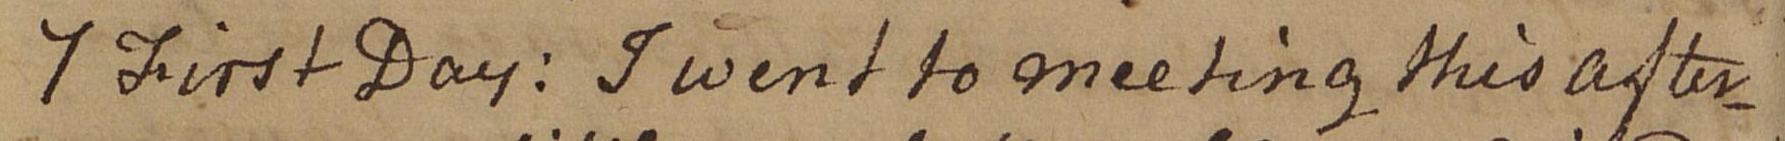7 First Day: I went to meeting this after-
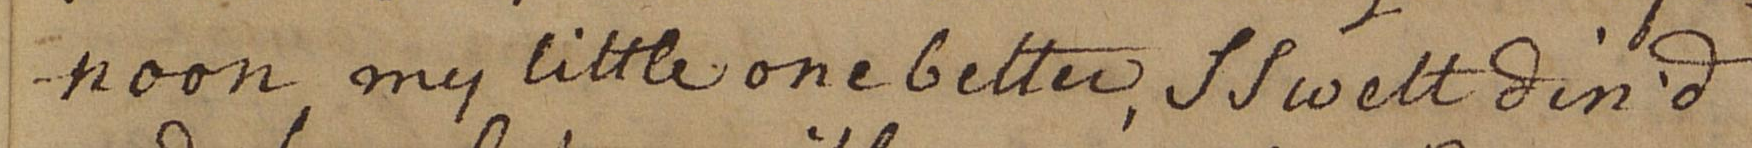-noon my little one better, S Swett din'd
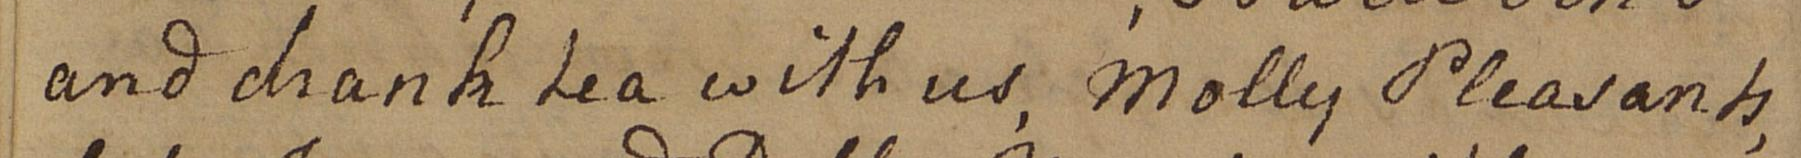and drank tea with us, Molly Pleasants
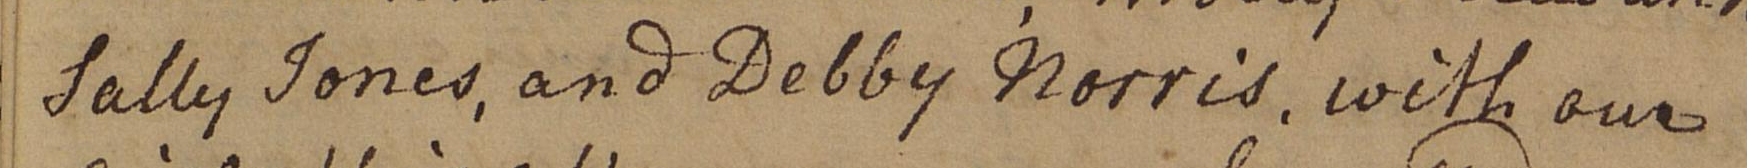Sally Jones, and Debby Norris, with our
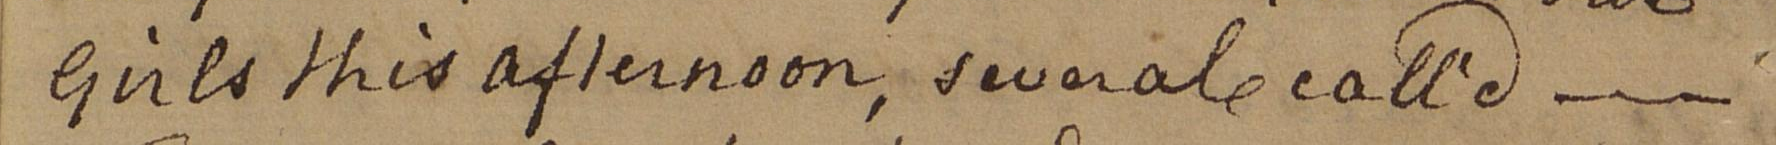Girls this afternoon, several call'd-
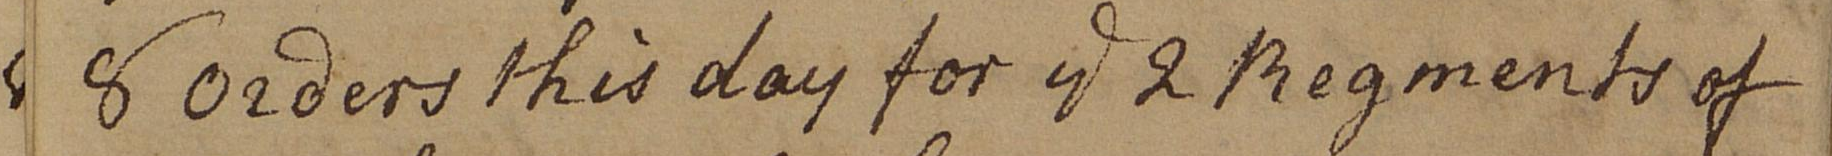8 orders this day for y^e 2 Regments of
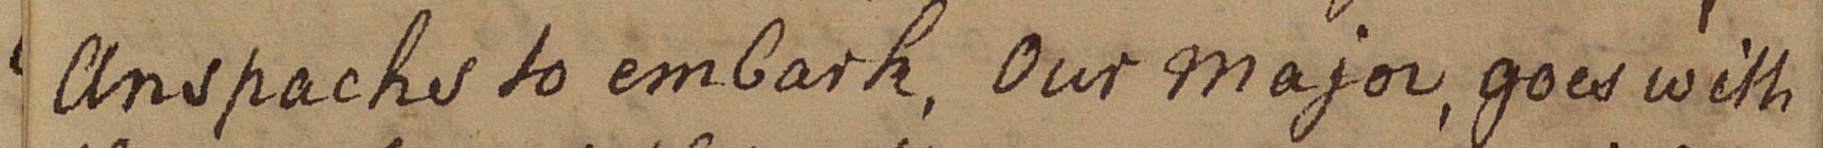Anspachs to embark, our major, goes with
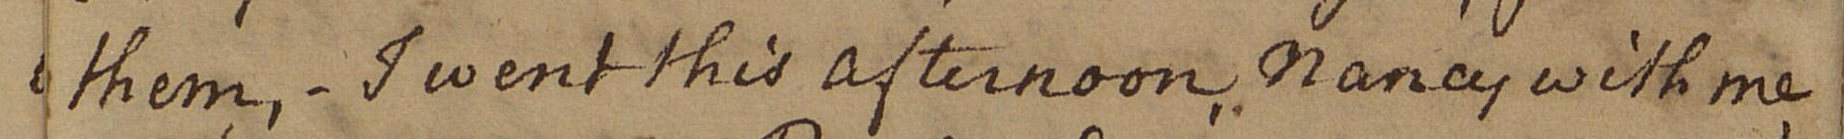them,- I went this afternoon, Nancy with me,
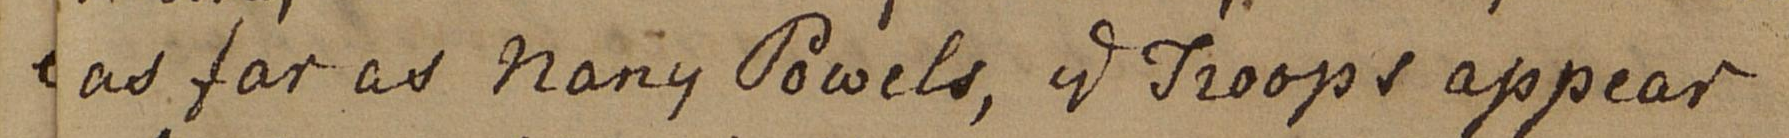as far as Nany Powels, y^e Troops appear
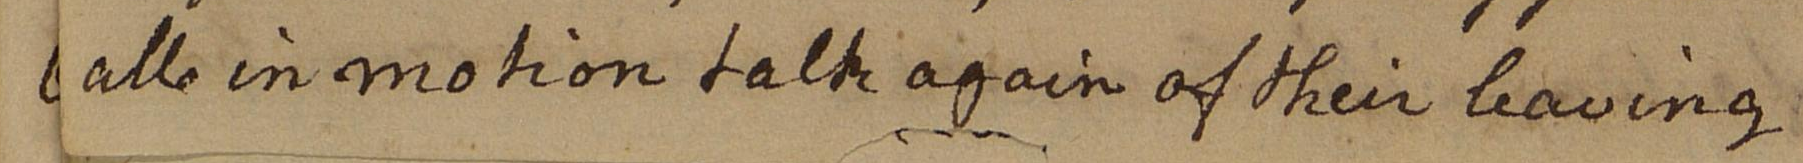all in motion talk again of their leaving
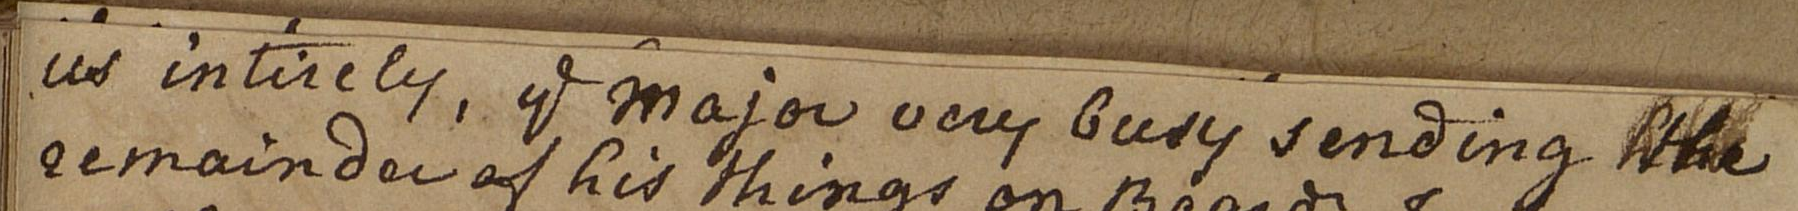us intirely, y^e Major very busy sending the
